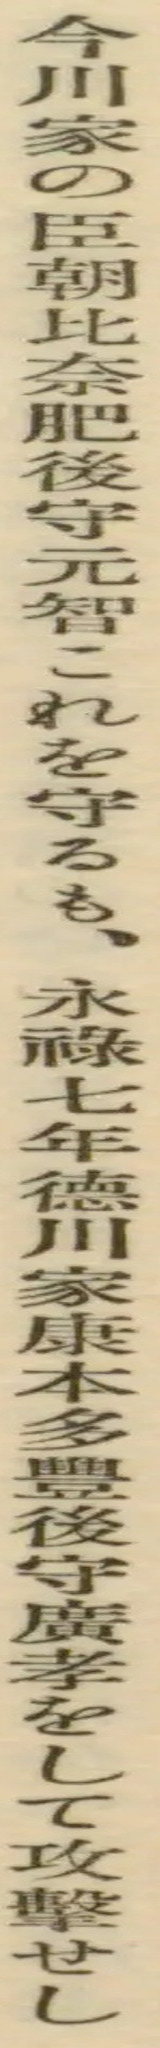今川家の臣朝比奈肥後守元智これを守るも、永禄七年徳川家康本多豊後守広孝をして攻撃せし
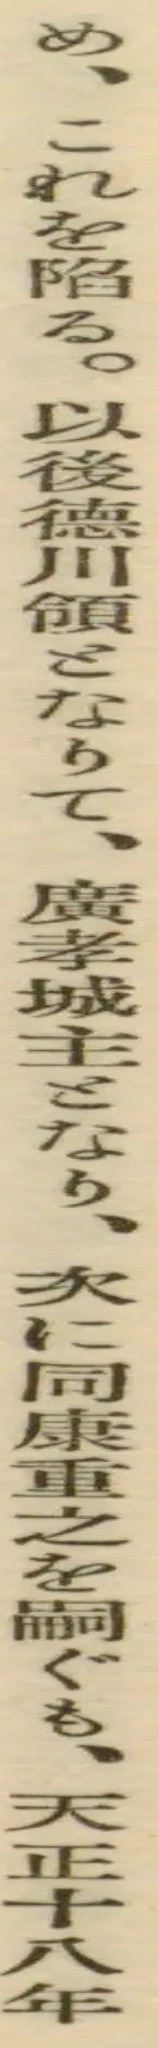め、これを陥る。以後徳川領となりて、広孝城主となり、次に同康重之を嗣ぐも、天正十八年
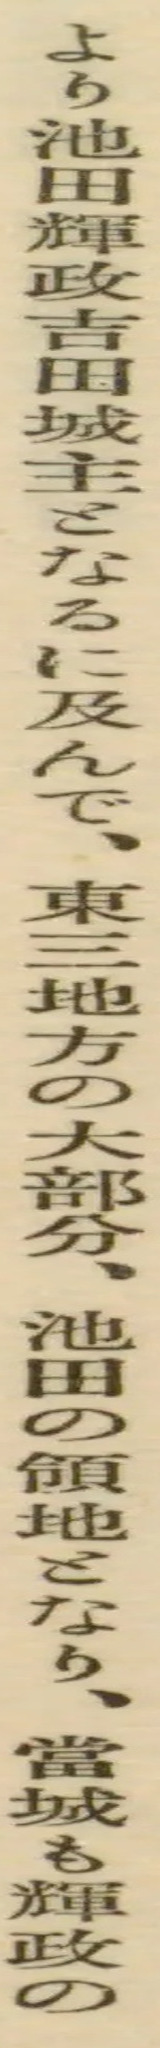より池田輝政吉田城主となるに及んで、東三地方の大部分、池田の領地となり、当城も輝政の
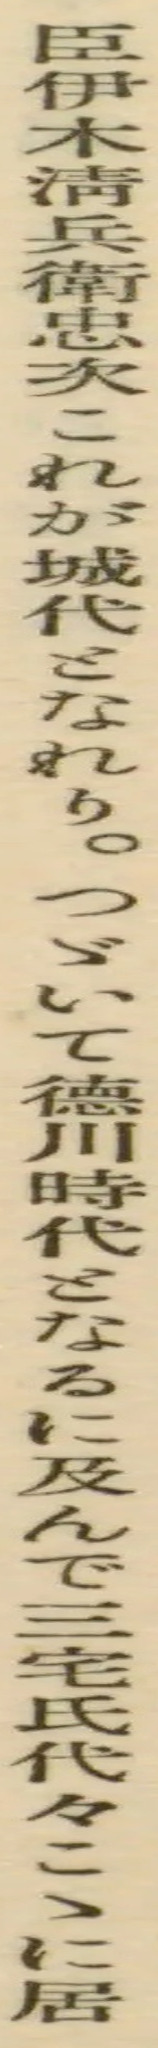臣伊木清兵衛忠次これが城代となれり。つゞいて徳川時代となるに及んで三宅氏代々こゝに居
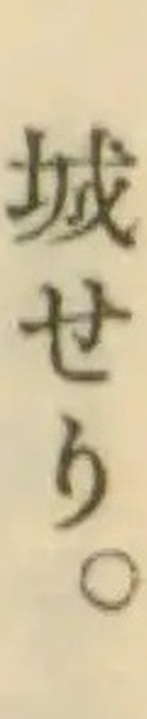城せり。
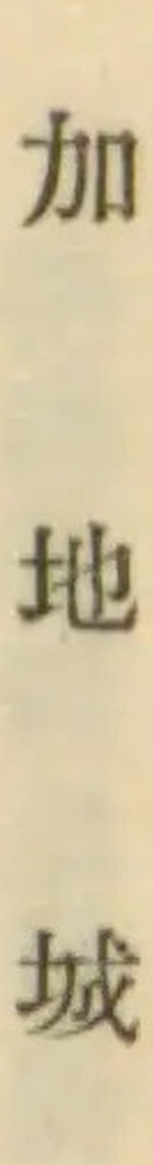加地城
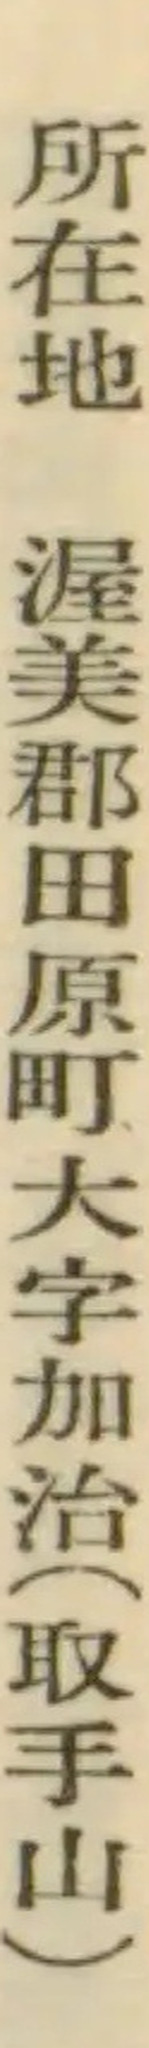所在地渥美郡田原町大字加治(取手山)
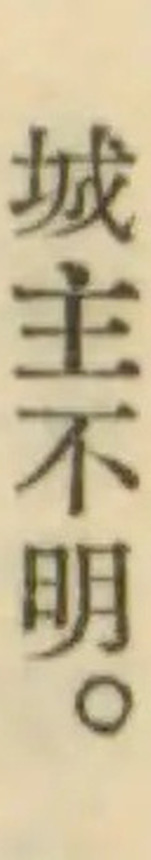城主不明。
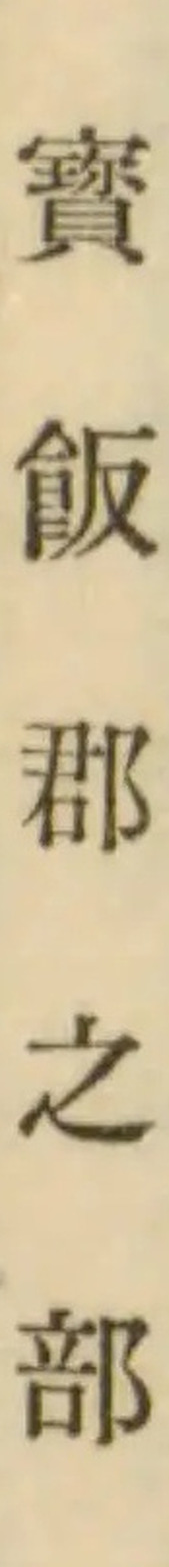宝飯郡之部

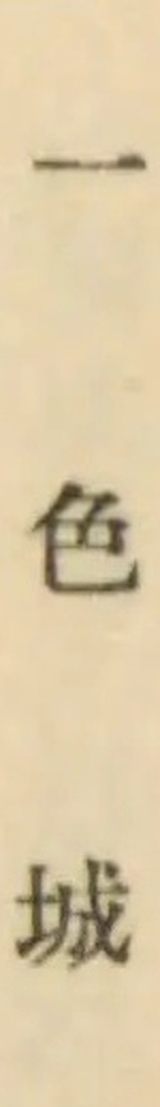一色城
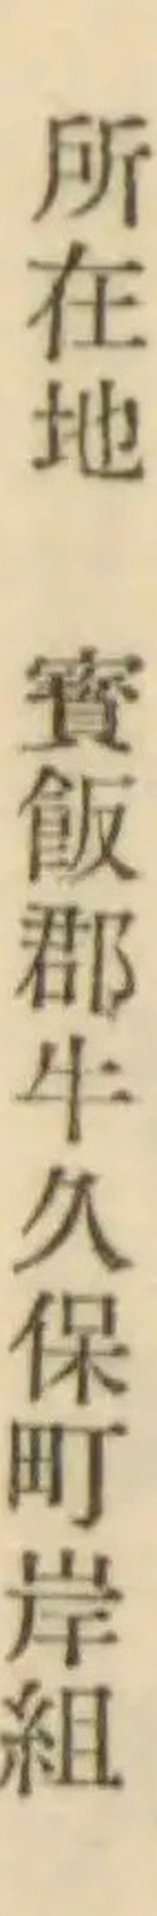所在地宝飯郡牛久保町岸組
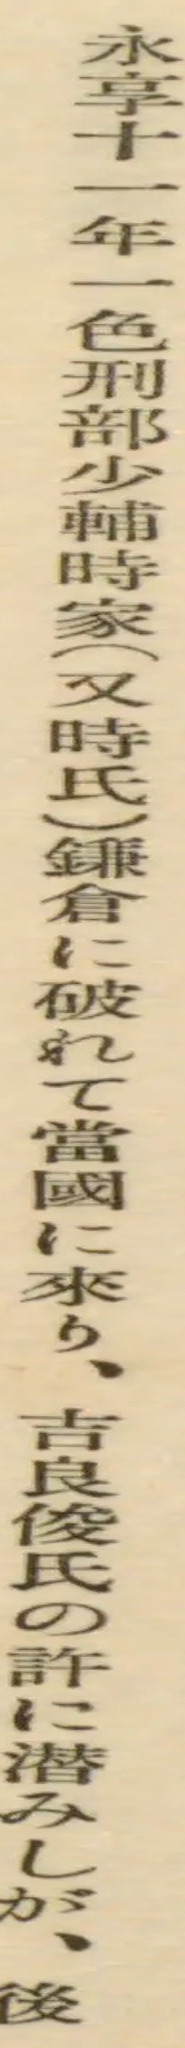永享十一年一色刑部少輔時家(又時氏)鎌倉に破れて当国に来り、吉良俊氏の許に潜みしが、後
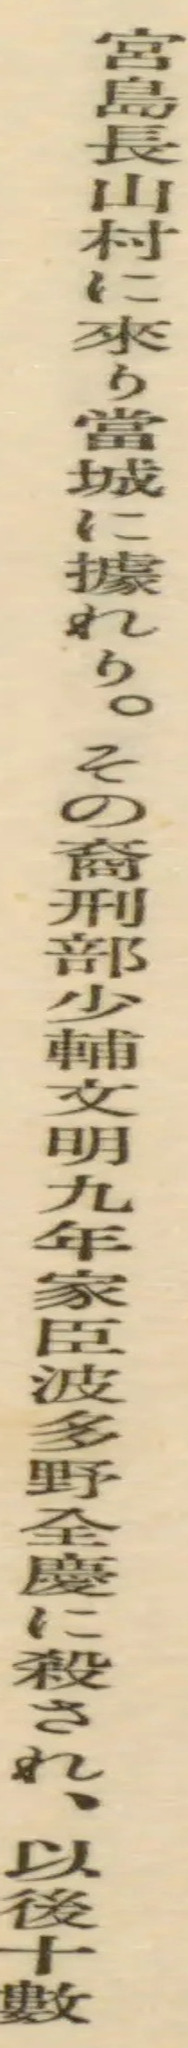宮島長山村に来り当城に拠れり。その裔刑部少輔文明九年家臣波多野全慶に殺され、以後十数
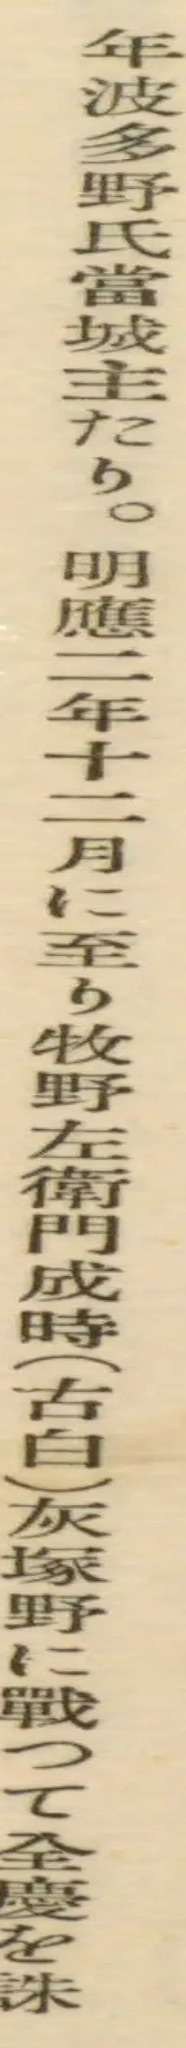年波多野氏当城主たり。明応二年十二月に至り牧野左衛門成時(古白)灰塚野に戦つて全慶を誅
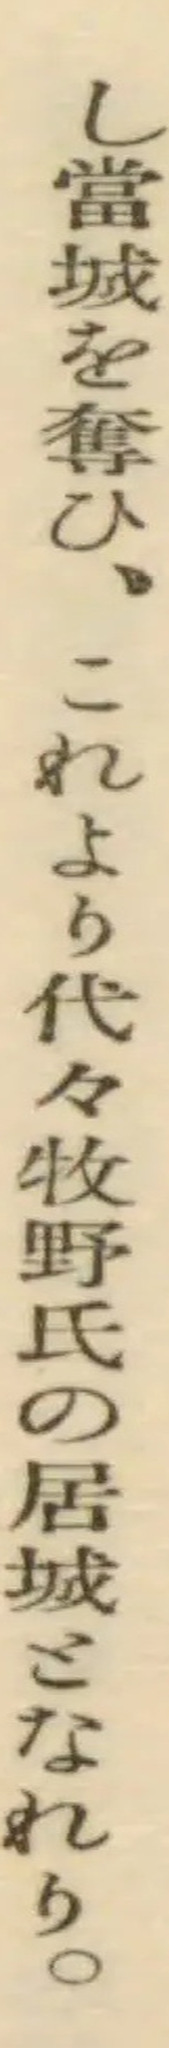し当城を奪ひ、これより代々牧野氏の居城となれり。
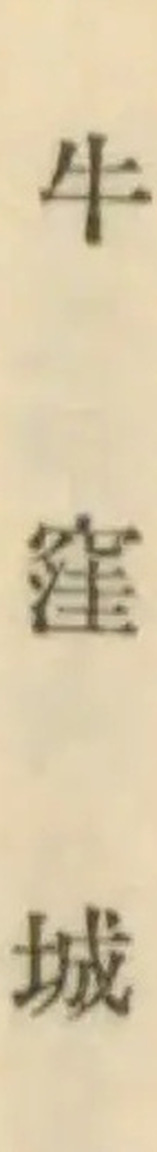牛窪城
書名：東三河之古城
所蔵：国立国会図書館 National Diet Library, JAPAN
